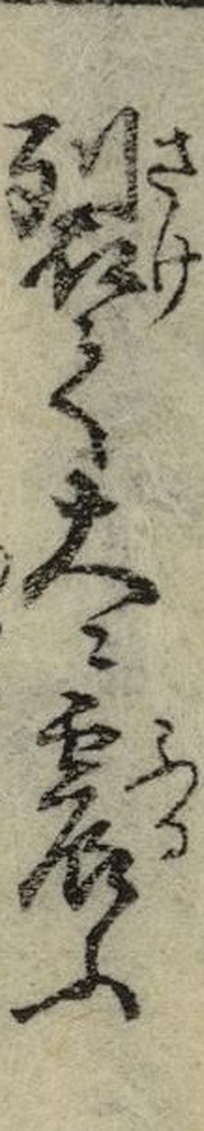裂て大に震ふ
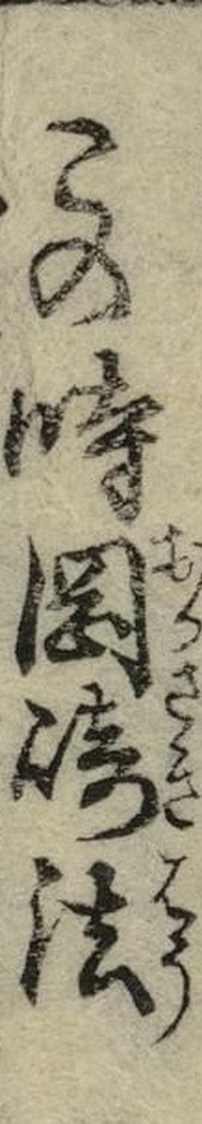この時岡崎法
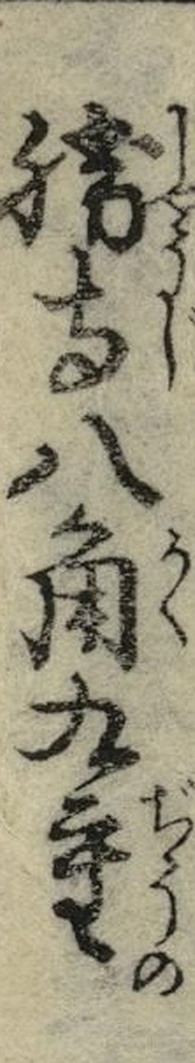勝寺八角九重
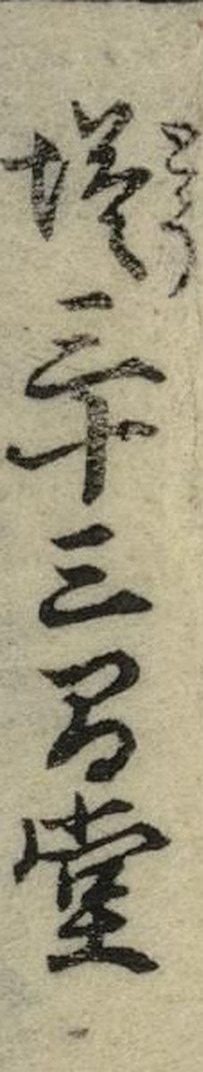塔三十三間堂
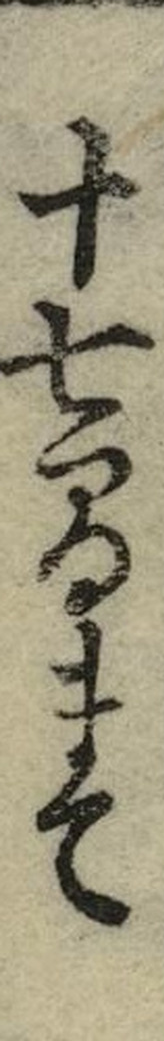十七間まて
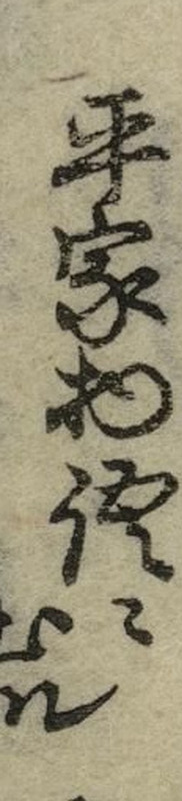平家物語ニ

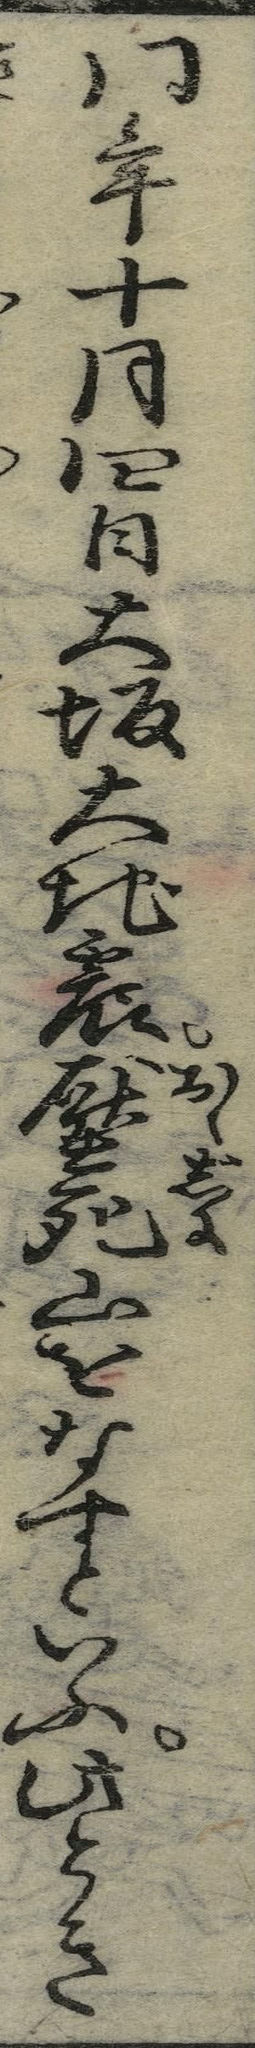同年十月四日大坂大地震。圧死山をなすといふ。此とき
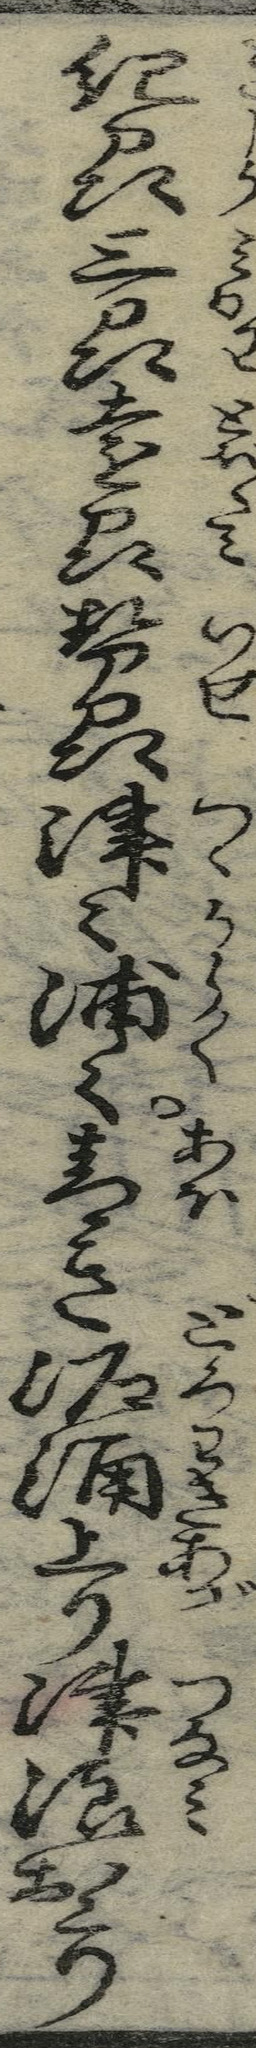紀州三州遠州勢州津々浦々。青き泥涌上り津浪おこり
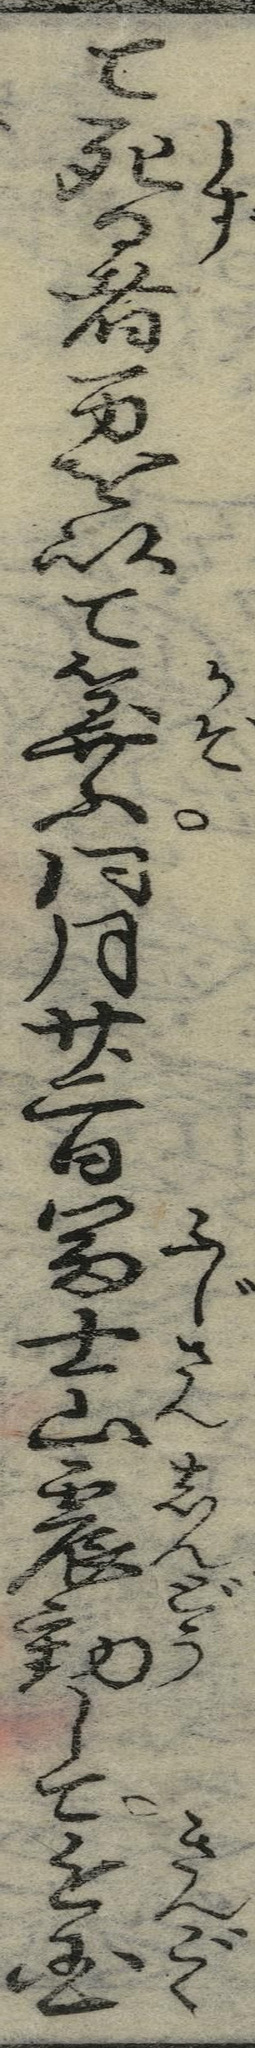て死る者万を以て算ふ。同月廿二日富士山震動して近国
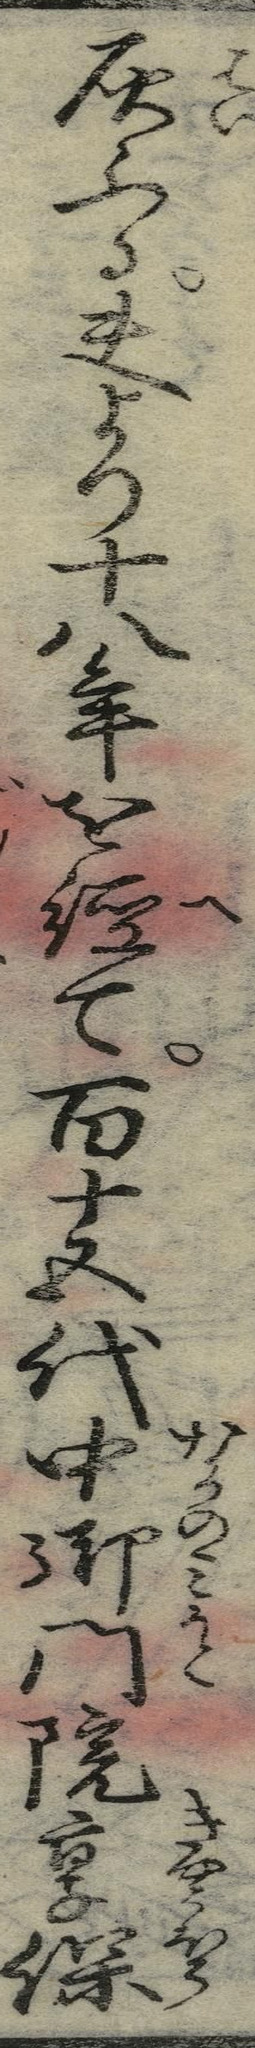灰ふる。夫より十八年を経て。百十五代中御門院享保
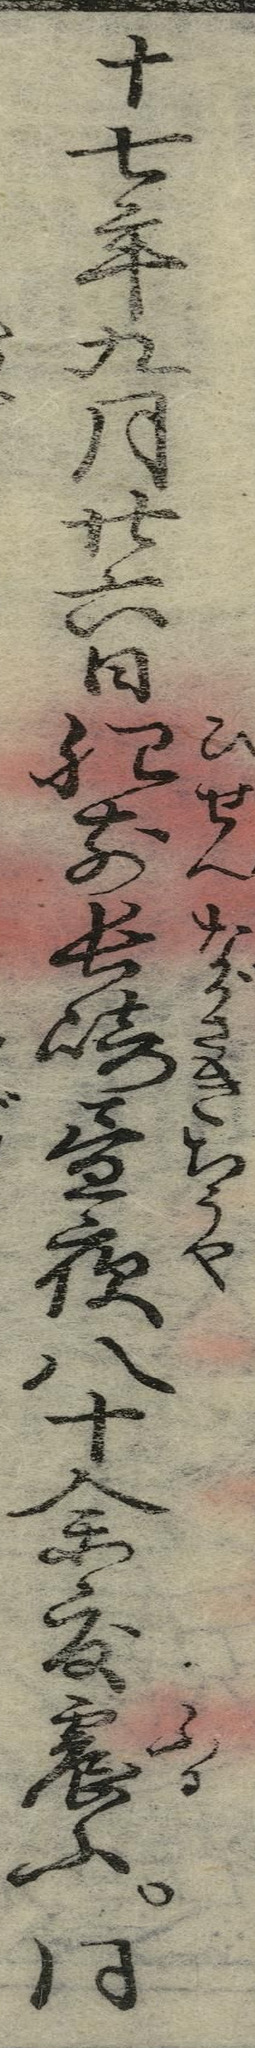十七年九月廿六日肥前長崎昼夜八十余度震ふ。同
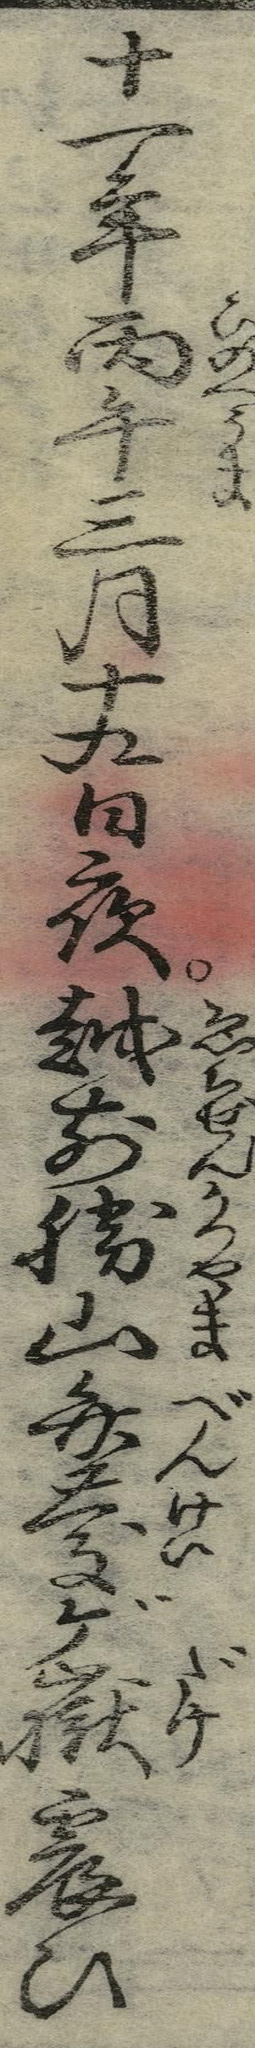十一年丙午三月十九日夜。越前勝山弁慶ゲ嶽震ひ
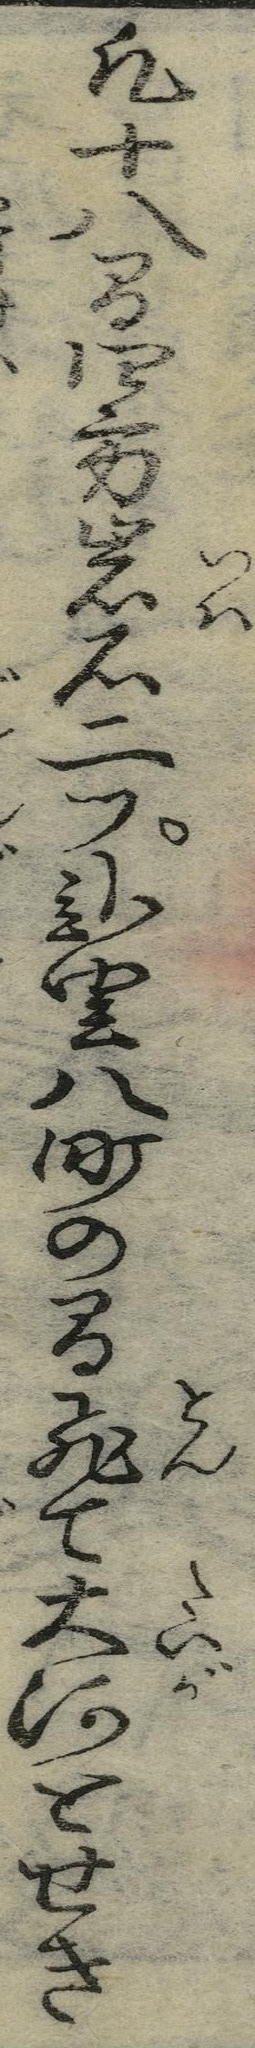凡十八間四方岩石二つ。弐里八町の間飛て大河とせき
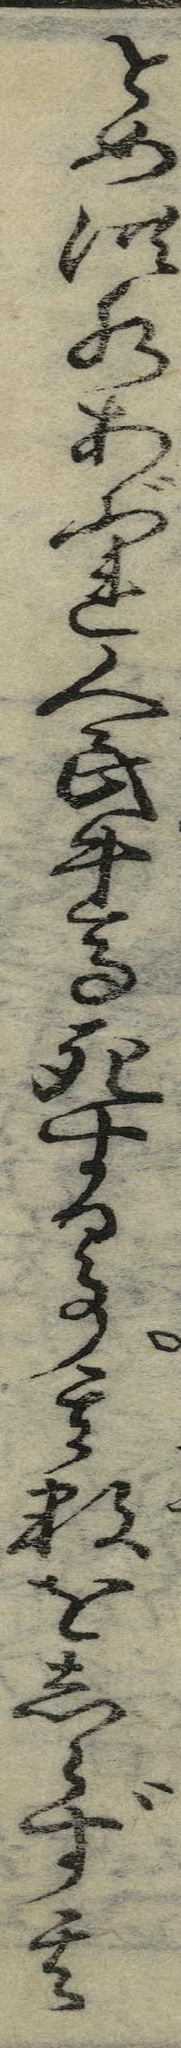とめ。洪水あぶれ人民牛馬死する事。其数をしらず其
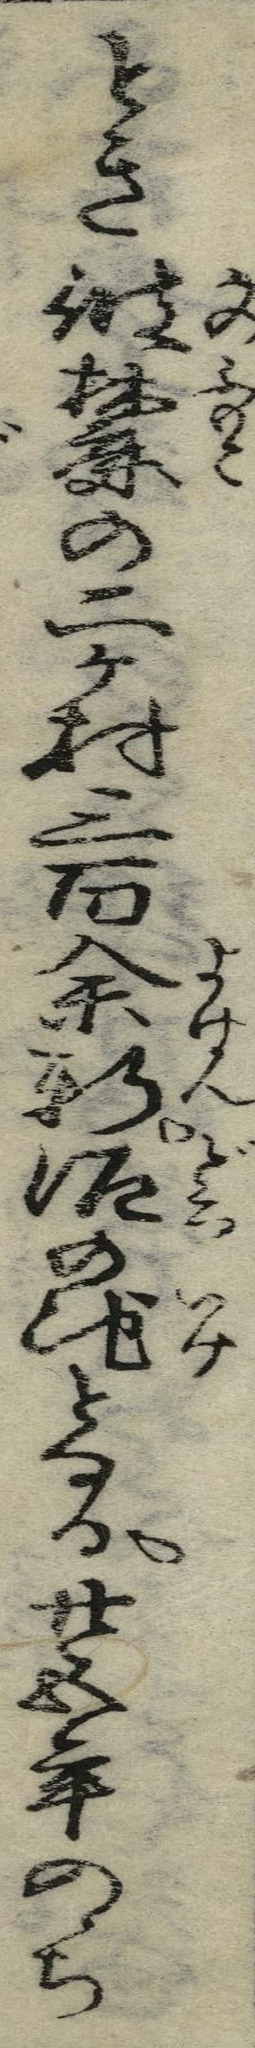とき彼麓の二ヶ村三百余軒。泥の池となる。廿五年のゝち
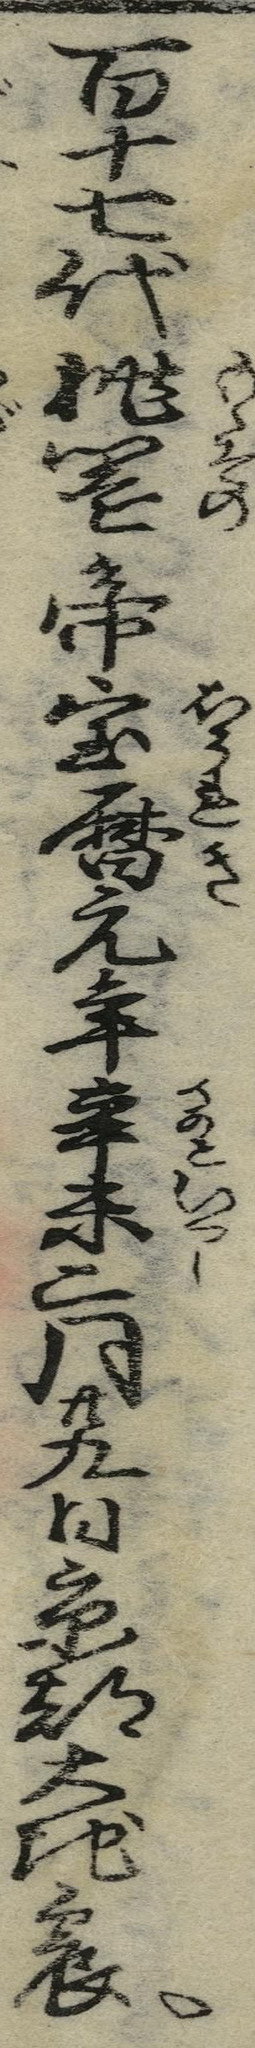百十七代桃園帝宝暦元年辛未二月廿九日京都大地震。
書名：本朝地震記　全
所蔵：東京大学地震研究所図書室 Earthquake Research Institute Library, The University of Tokyo, JAPAN
